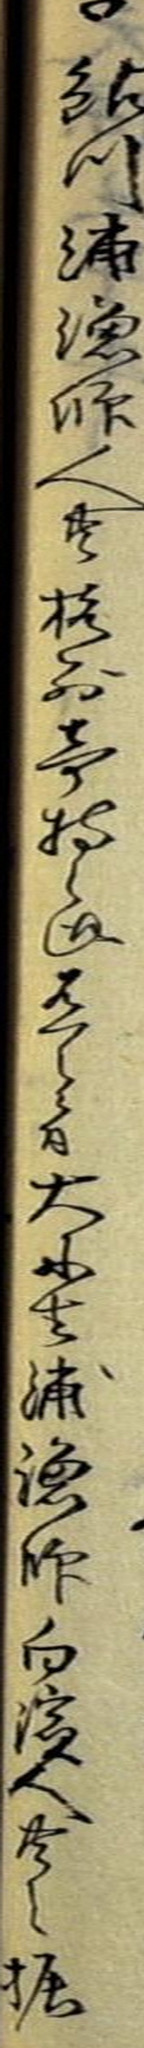○鮎川浦漁師人共格別奇特之趣有之ニ付大丹生浦漁師白浜人共之振
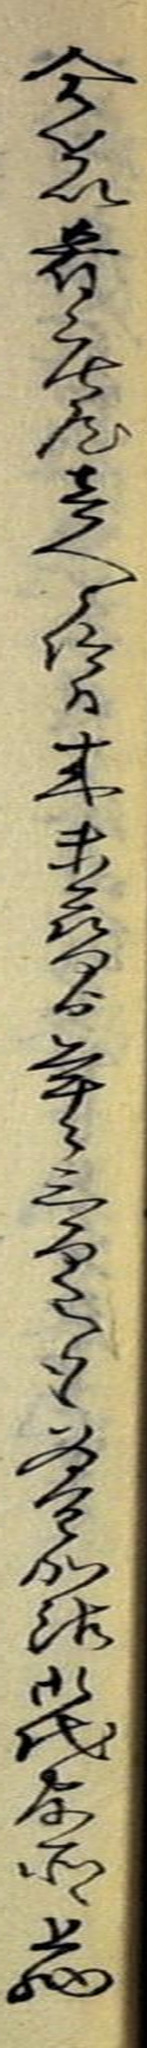合を以肴庄屋壱人被仰付来未節句ゟ年々三百匁ツヽ為冥加銀御代官所へ上納
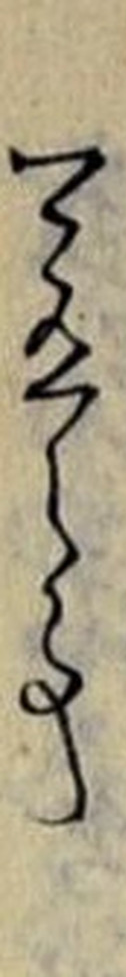可有之事
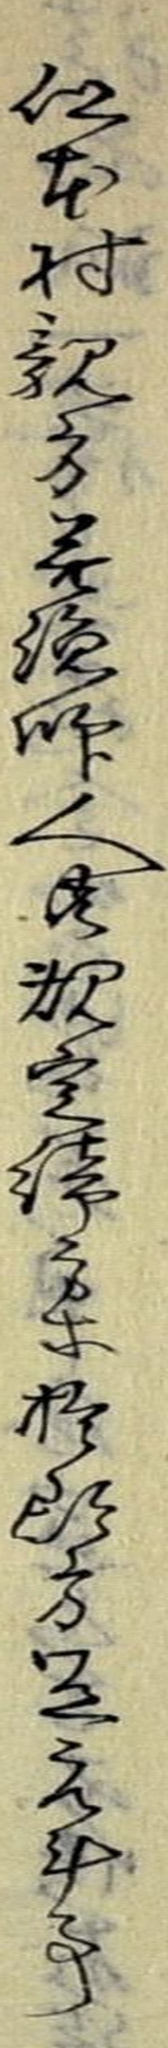但本村親方并漁師人共規定締方等於郡方宜取計事
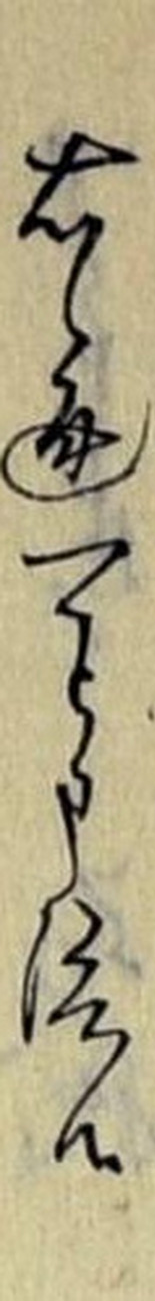右之通可被申渡候
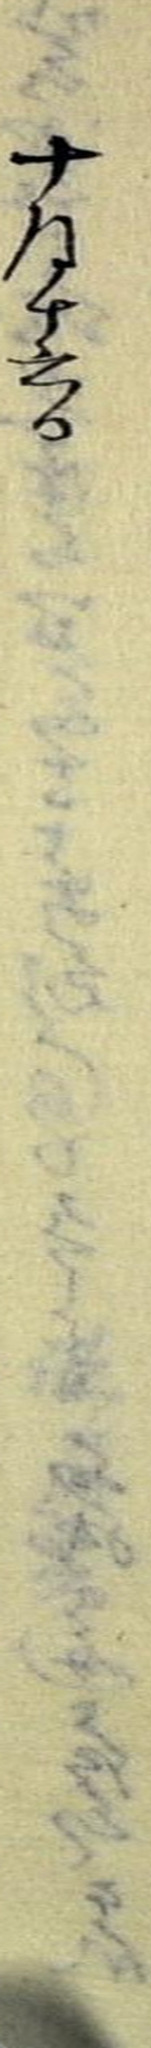十月十六日
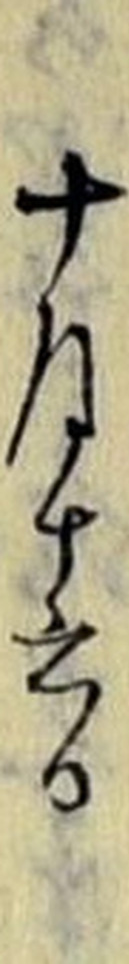十月十六日
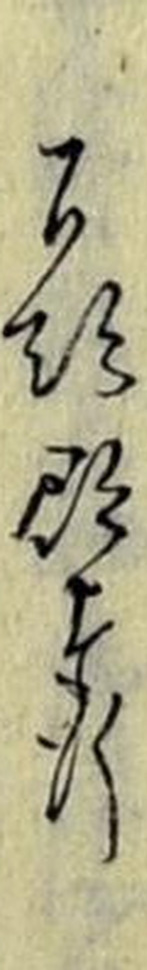下領郡奉行
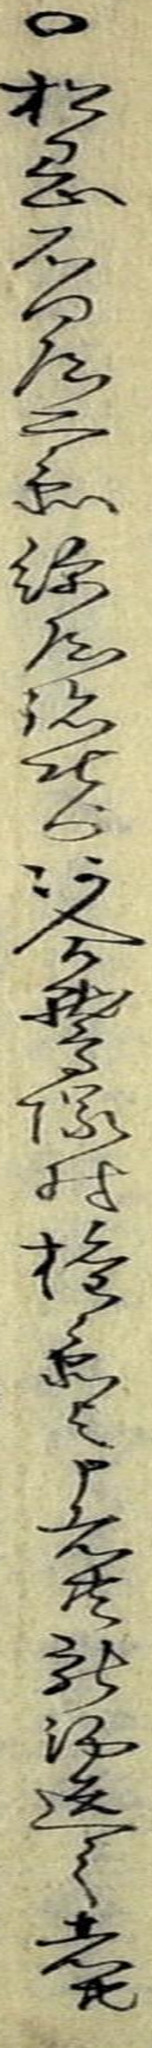○松岡石田屋二兵衛綿屋弥次右衛門河合鷲塚村権兵衛与申者共新酒造之者共
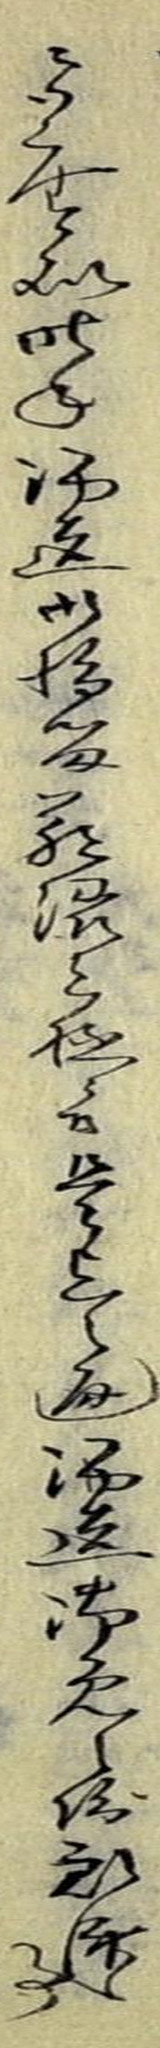ニ御座候処昨年酒造御指留難渋至極ニ付是迄之通酒造御免之儀願済之事
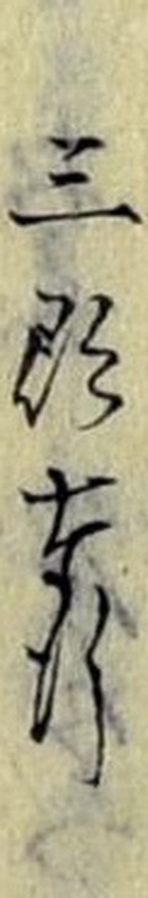三郡奉行
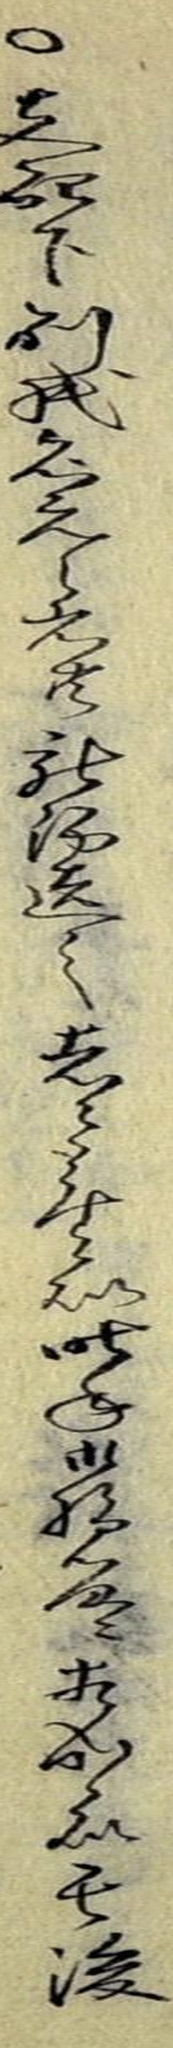○支配下別紙名元之者共新酒造之者ニ御座候処昨年御指留ニ相成候処其後
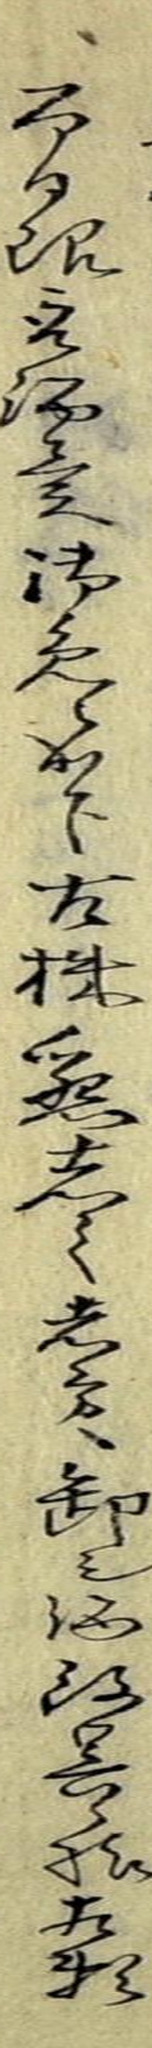百日限取酒売御免被成下古株懇志之者方へ卸シ酒致呉候様相頼
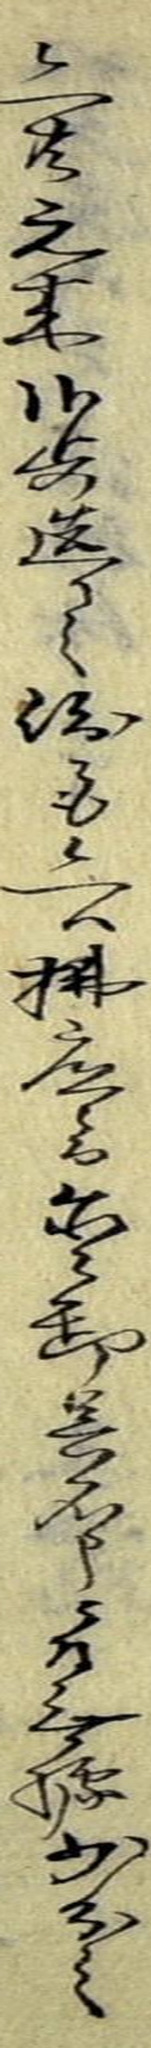候へ共元来弐歩造り之儀ニも候へハ払底ニ而爾々卸呉不申ニ付無拠少分之
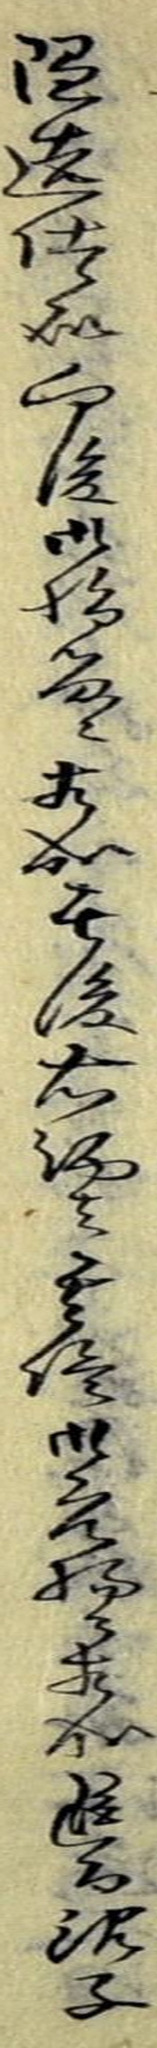隠造仕候処向後御指留ニ相成其後右酒者其儘御取揚ニ相成追而銀子

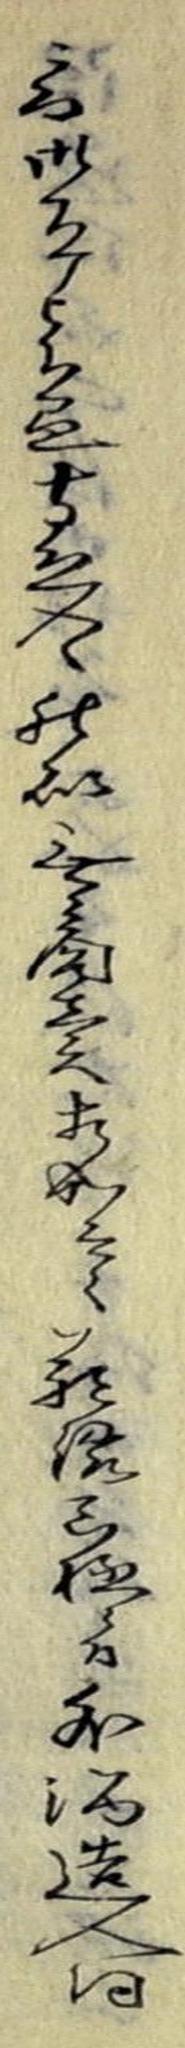ニ而御下ケ置奉恐入候然処無商売相成云々難渋至極ニ付外酒造人同
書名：命令之部 五
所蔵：福井県文書館 Fukui Prefectural Archives
